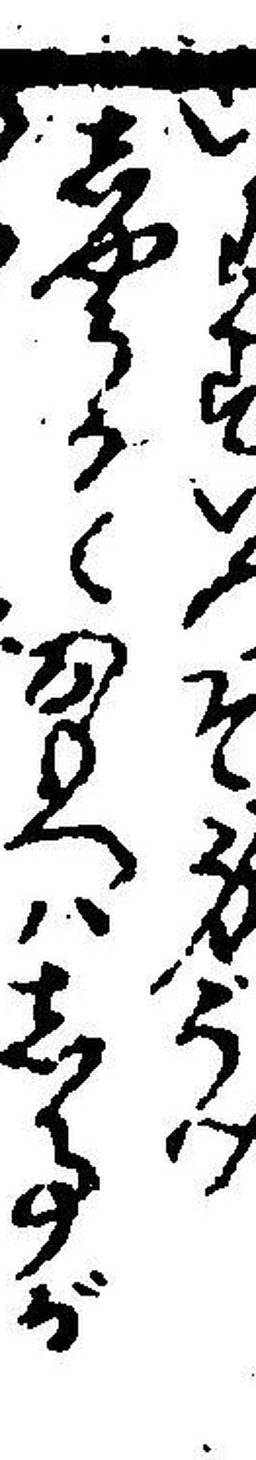しやうかとおもへはし事が
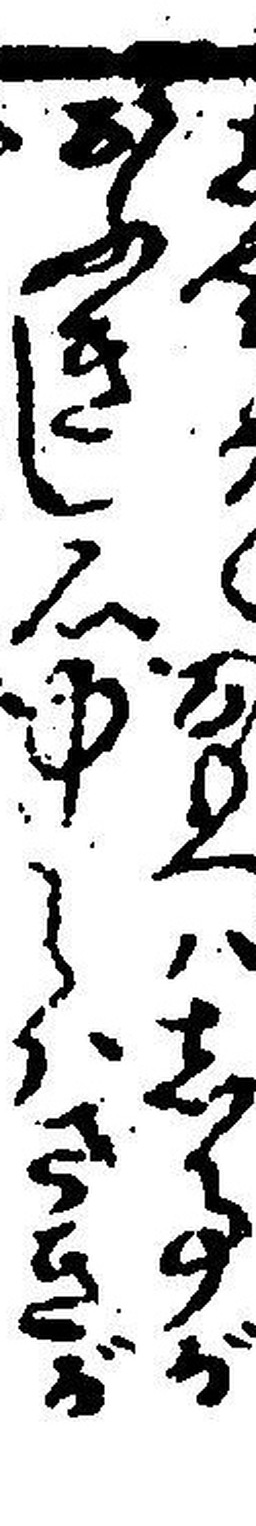おふきし心中にはさきが
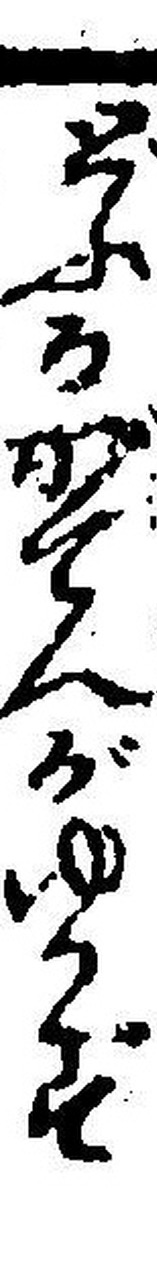どふかがてんがゆかず
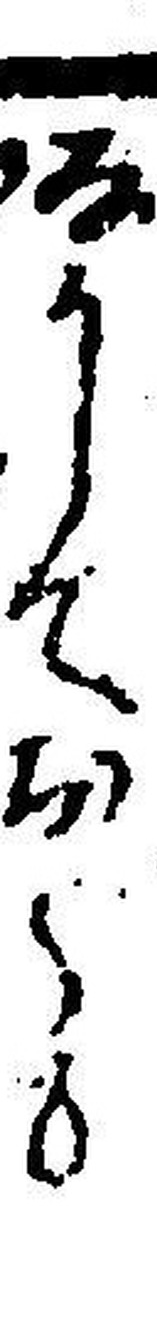なかしておくも
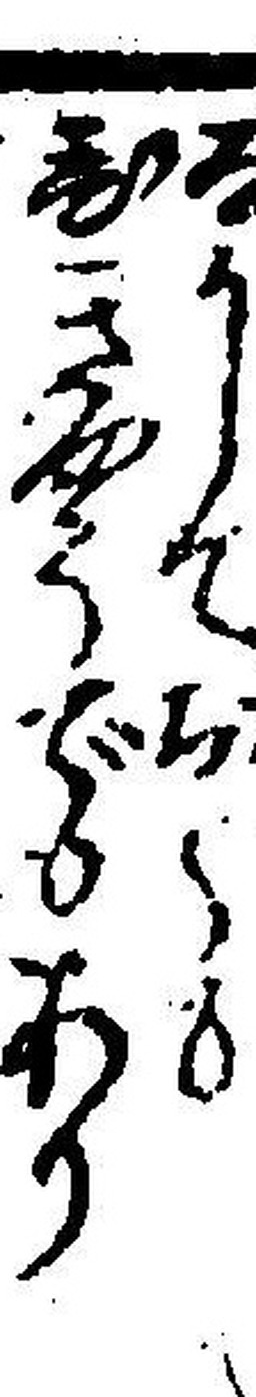ひきやうでもあり
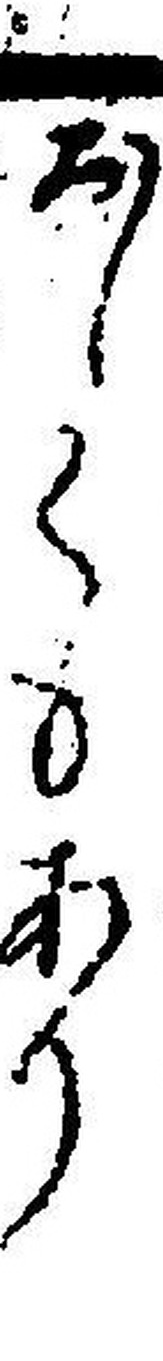おしくもあり
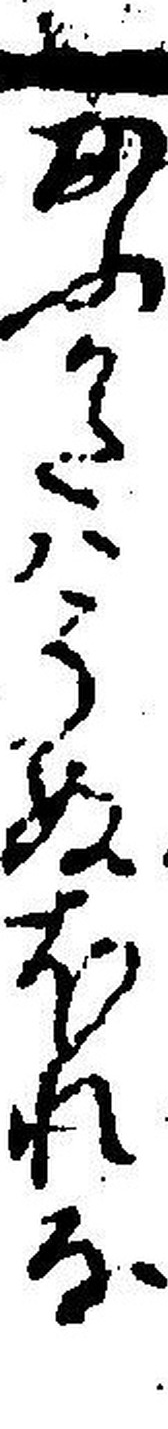おふかたはうぬほれな
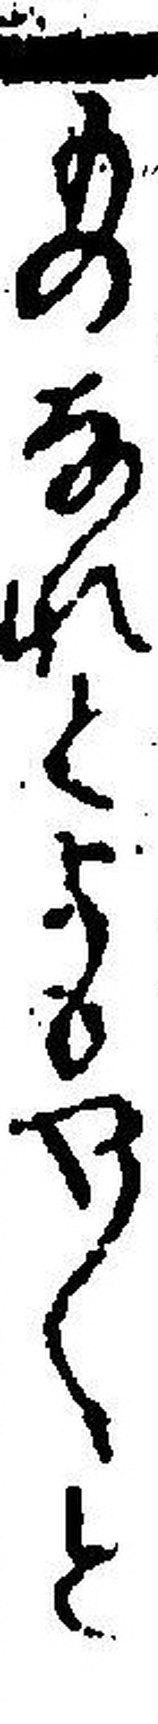ものなれとよもや〳〵と
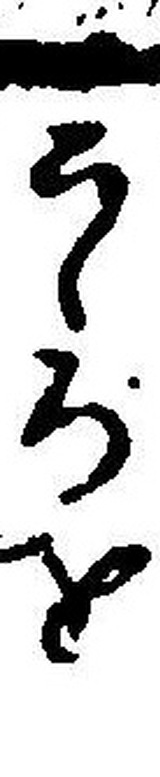こゝろを
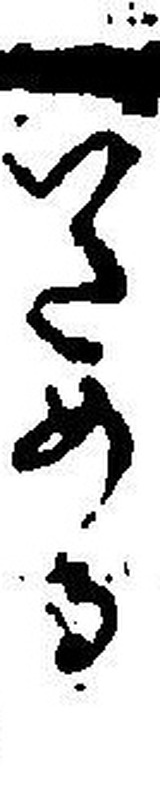いためる

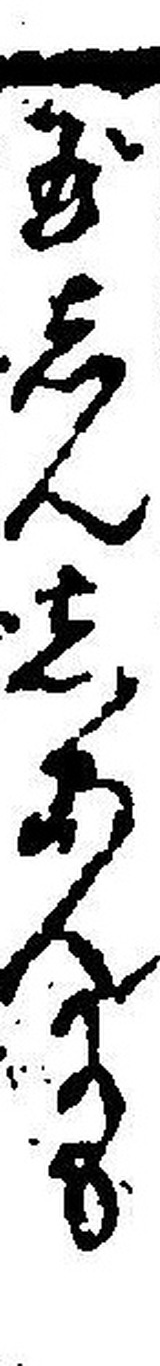玉しんしあんにも
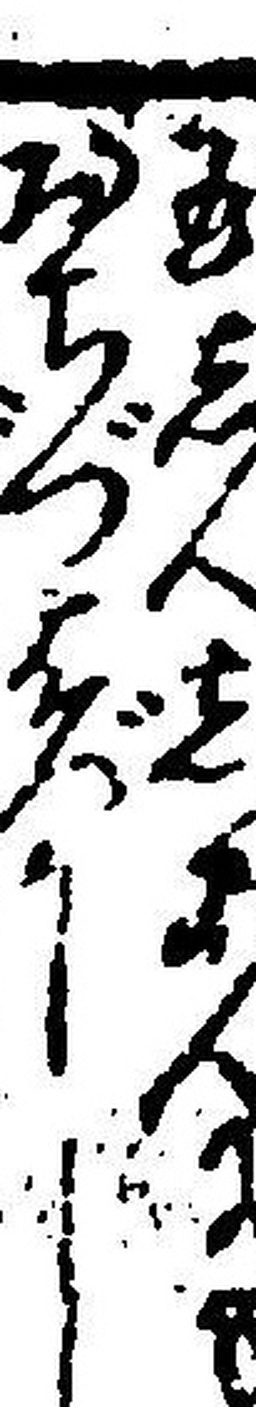おちづはづかし
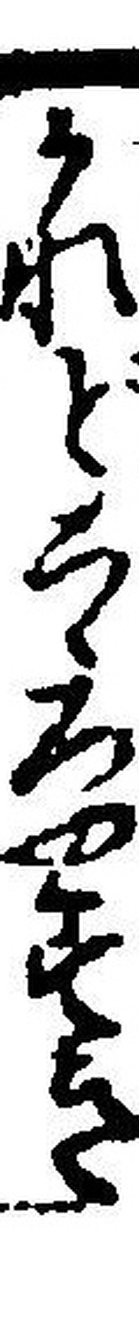かれどこゝろやすき
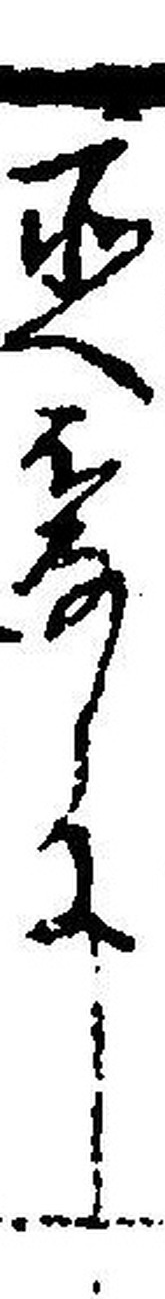所へはなしに
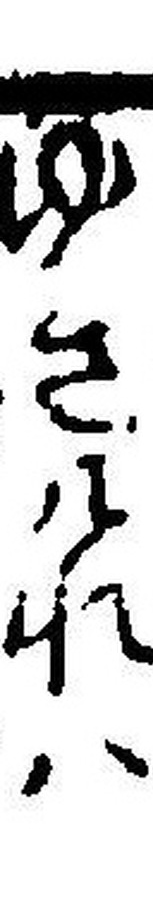ゆきけれは
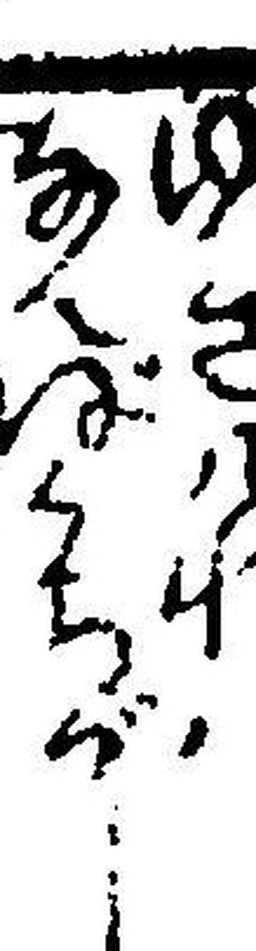なんぼくちが
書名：間違狐之女郎買 / 市場通笑作
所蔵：東京大学総合図書館 General Library in the University of Tokyo, JAPAN
